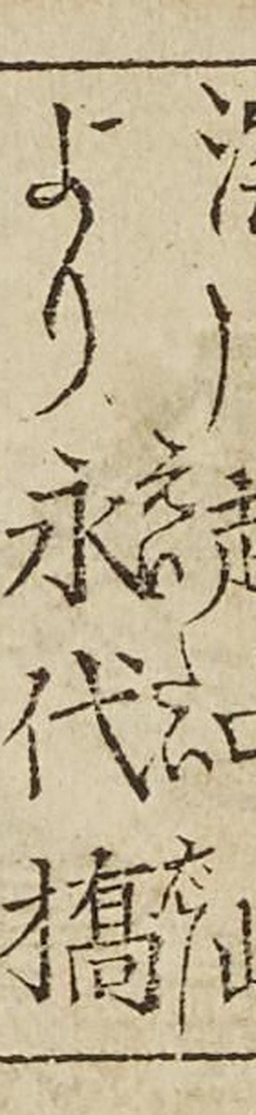より永代橋
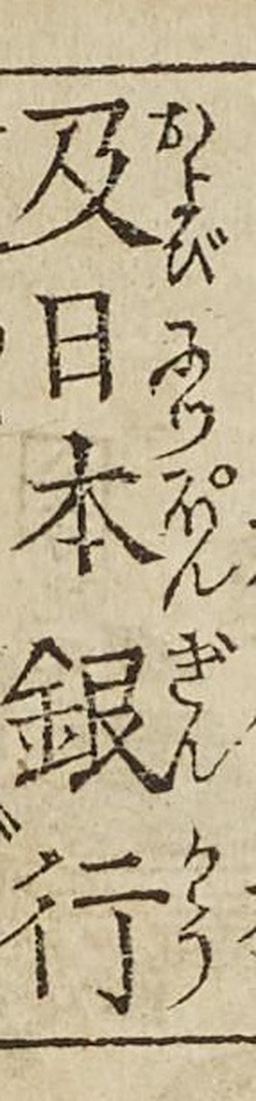及日本銀行
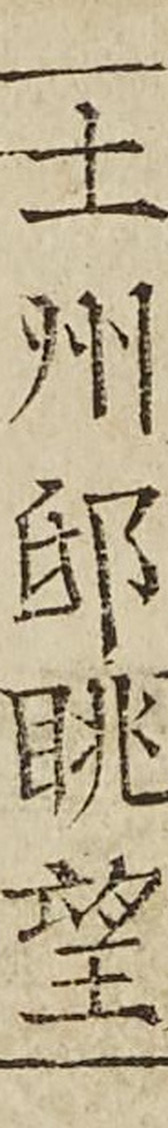土州邸眺望
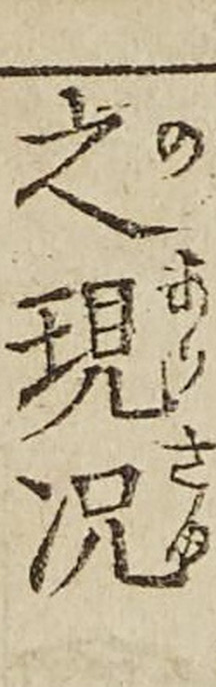之現況

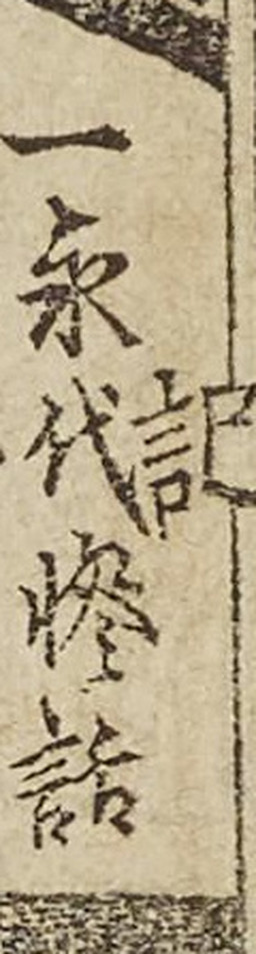一永代惨話
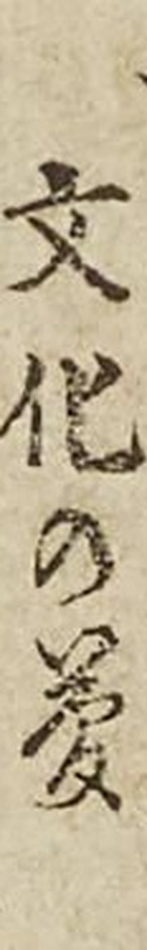文化の夢
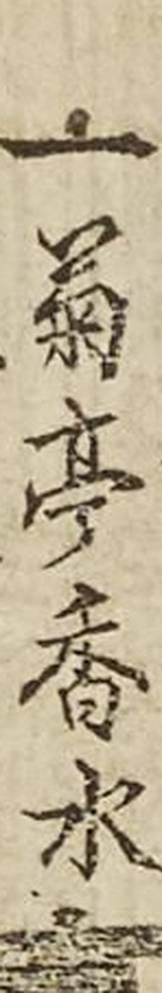一菊亭香水
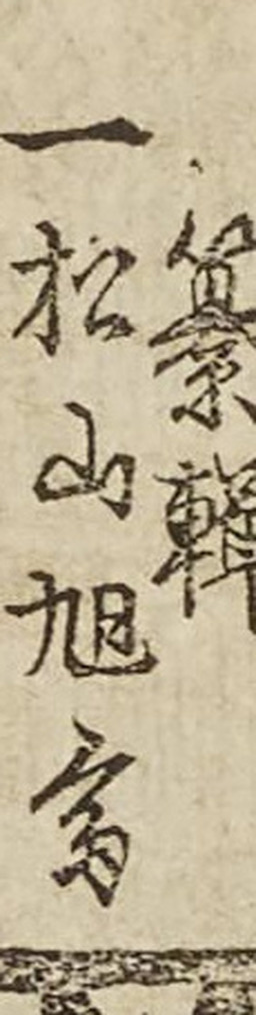一松山旭斎
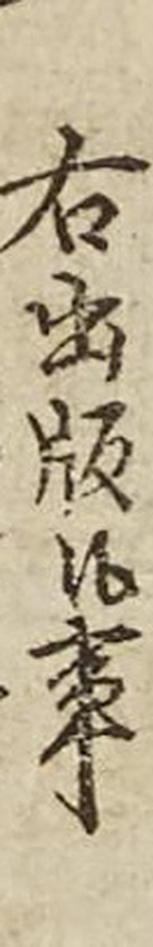右出版候事
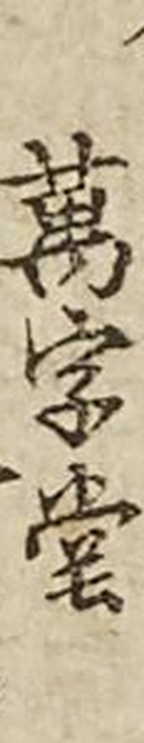萬字堂
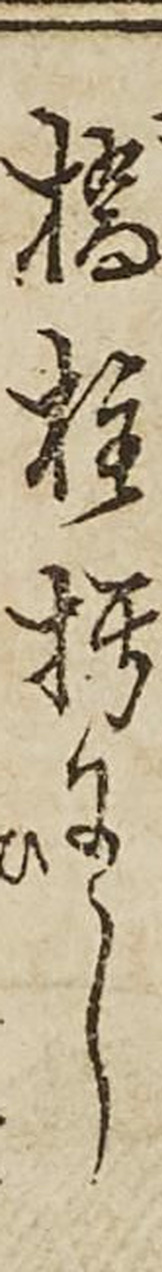橋柱朽にし
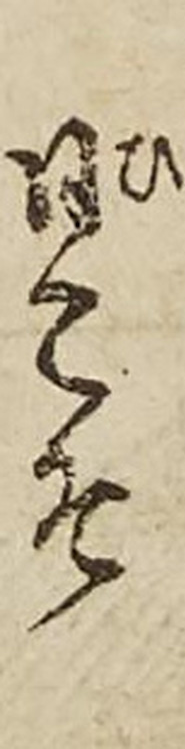日こそ
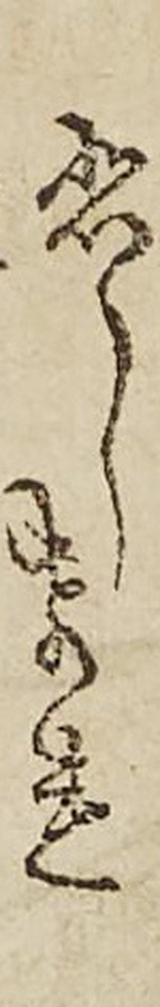悲しけれ
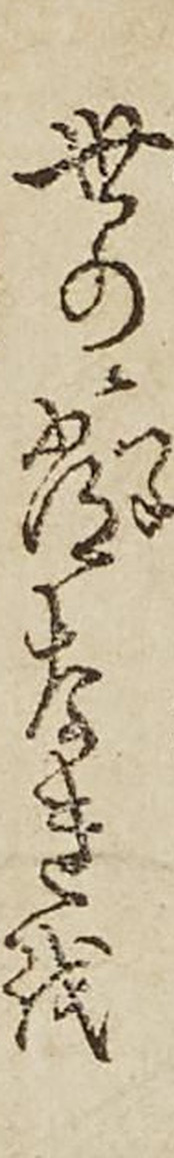世の常なきを
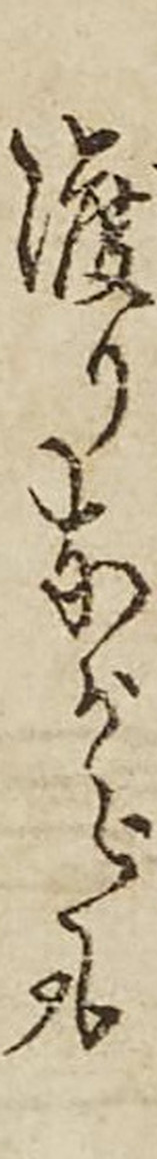渡りながらも
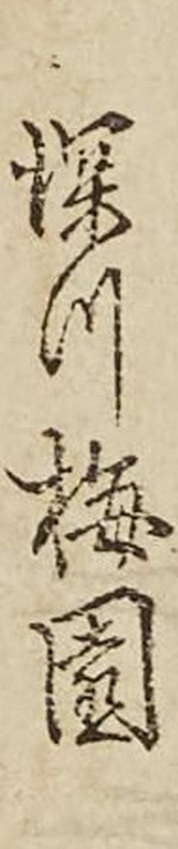深川梅園
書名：永代惨話　文化の夢　全
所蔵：東京大学地震研究所図書室 Earthquake Research Institute Library, The University of Tokyo, JAPAN
